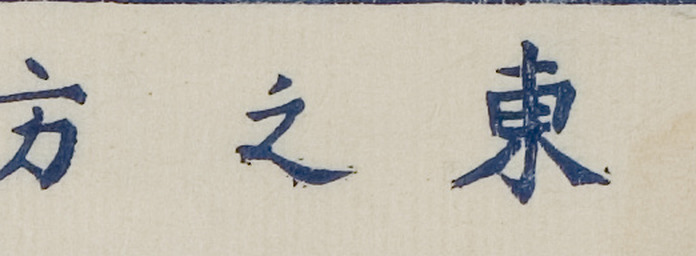東之方
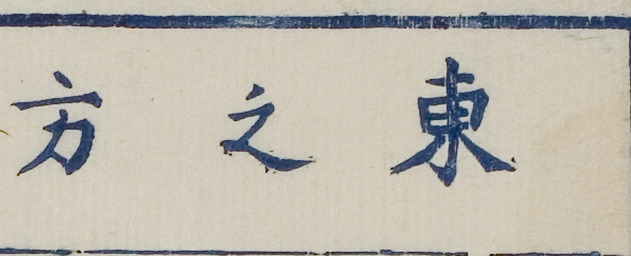東之方
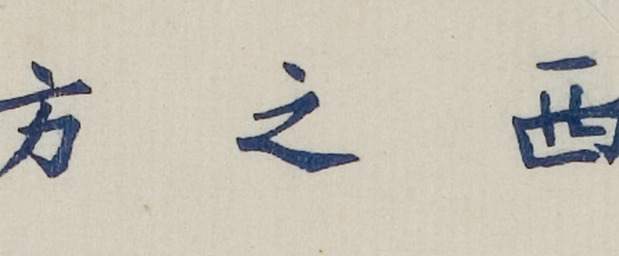東之方
